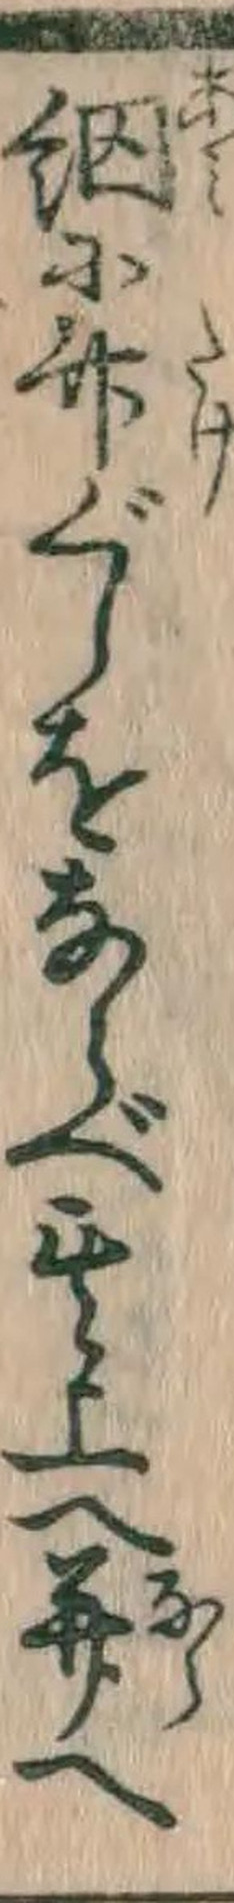網に竹ぐしをならべ其上へ并へ
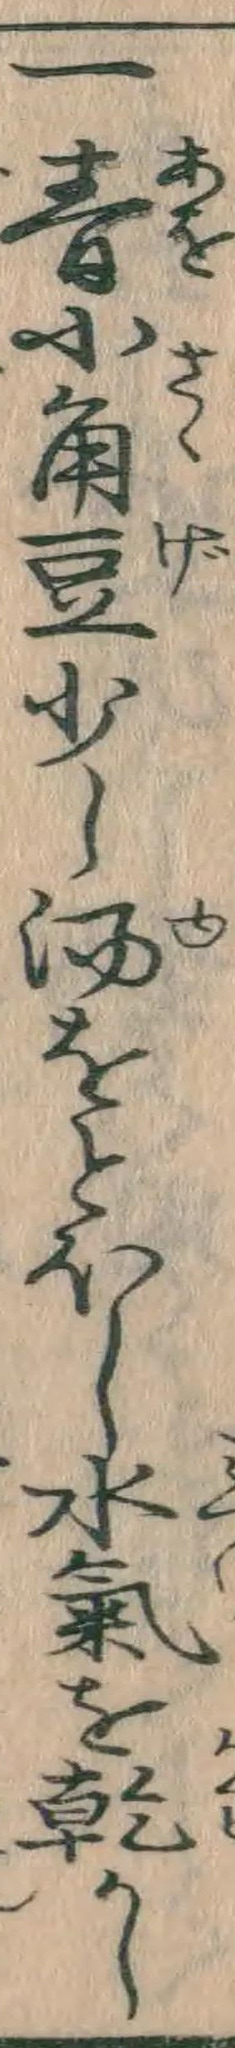一青小角豆少し湯をとほし水気を乾かし
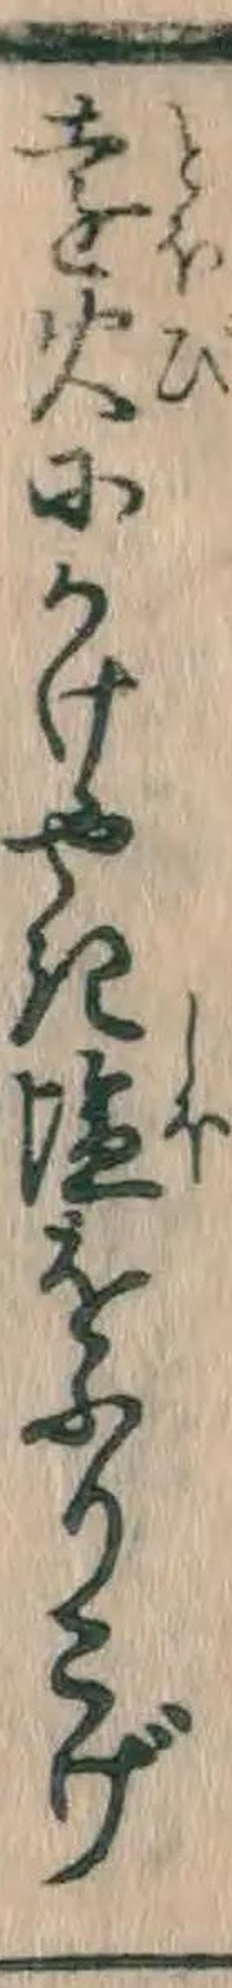遠火にかけやき塩をふりこげ
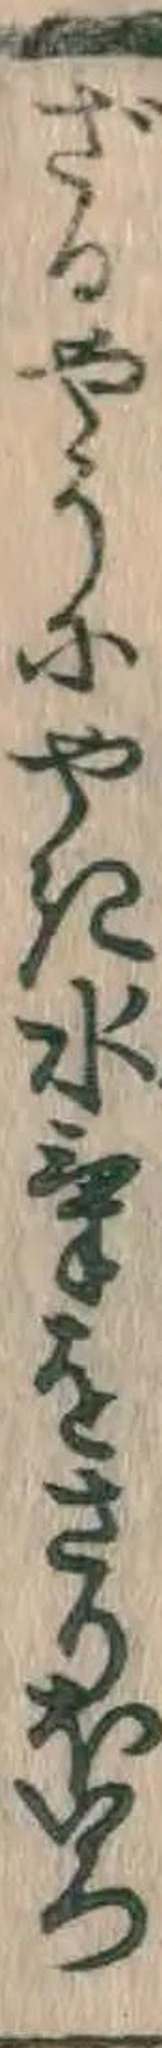ざるやうにやき水気をさりほいろ
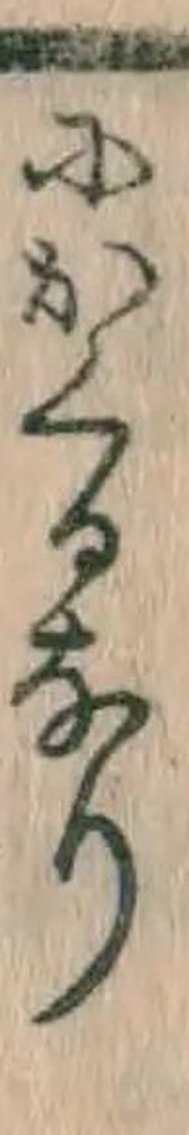にかくるなり
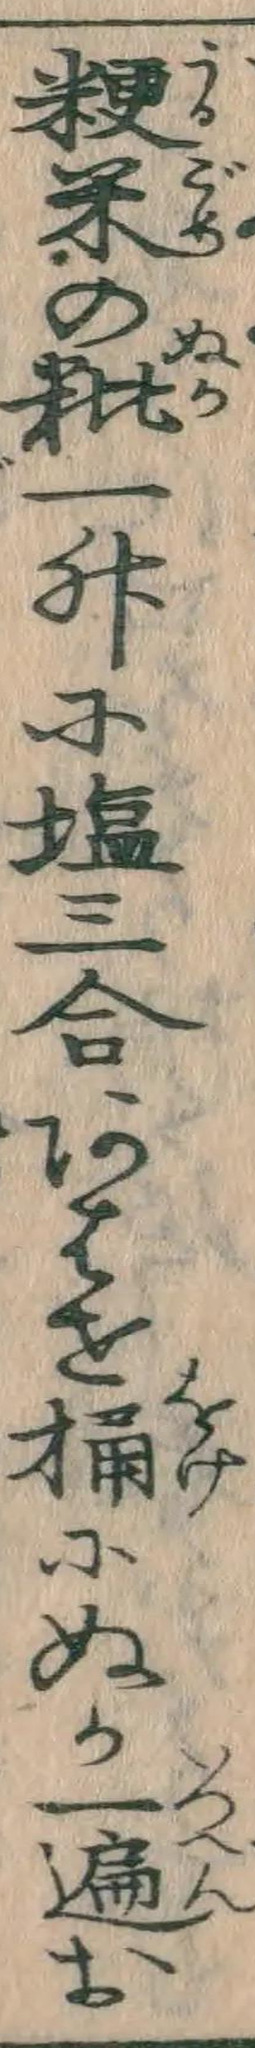粳米の粃一升に塩三合あはせ桶にぬか一遍お
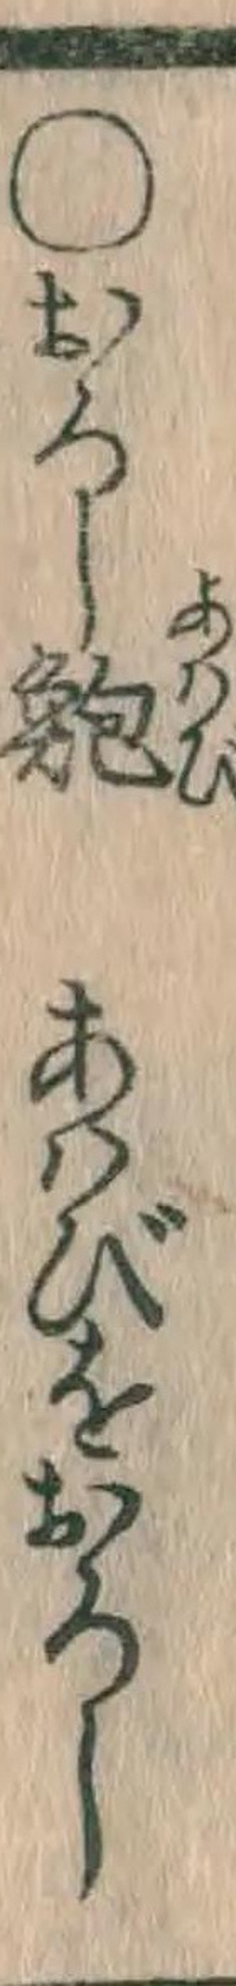○おろし鮑あはびをおろし
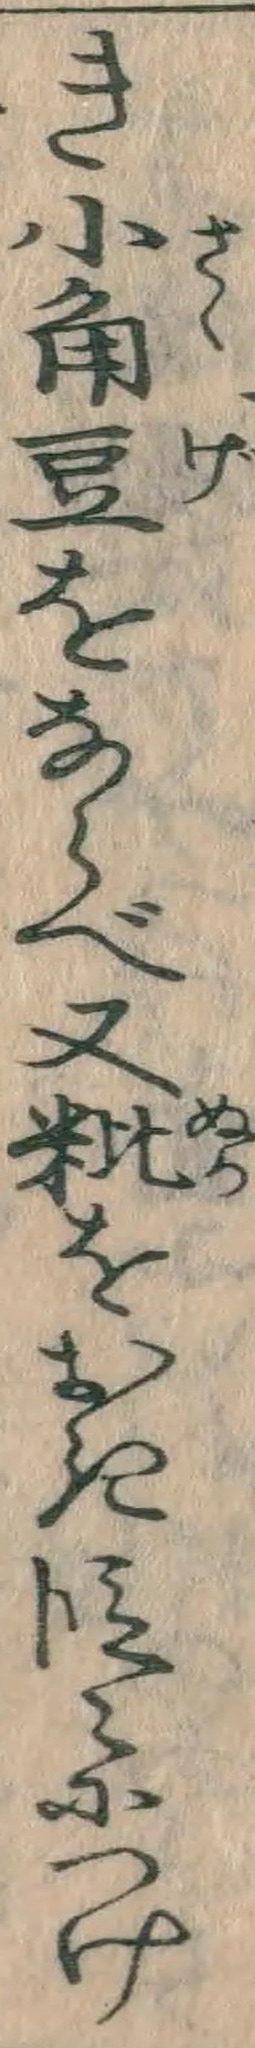き小角豆をならべ又粃をおき段々につけ
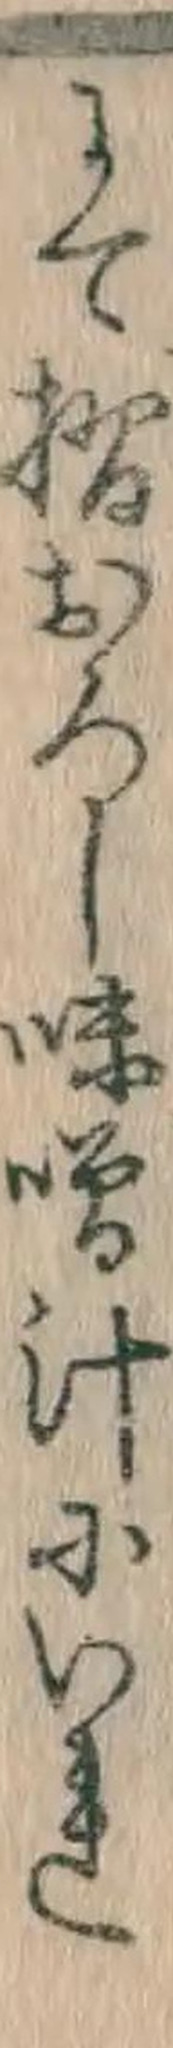にて摺おろし味噌汁にいれ
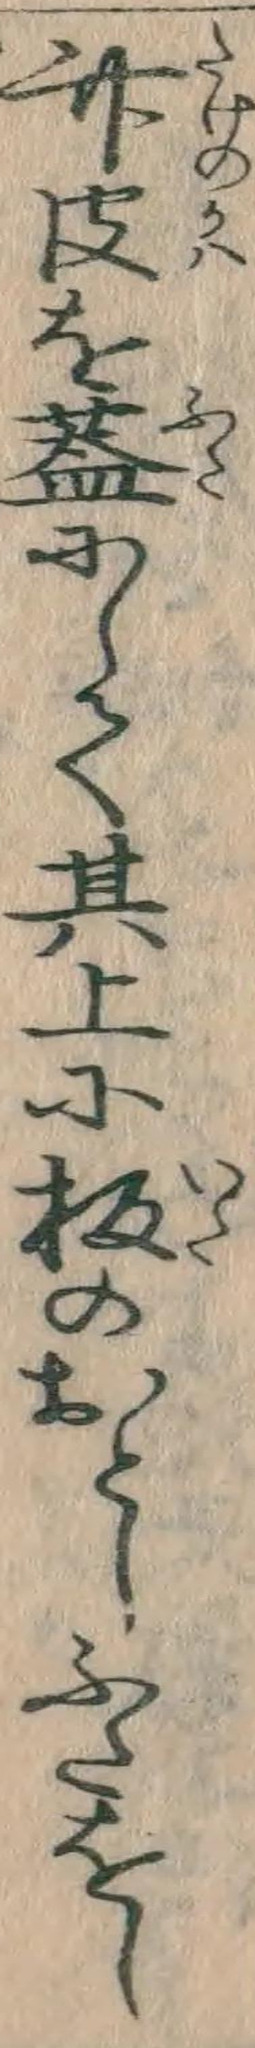竹皮を蓋にして其上に板のおとしふたをし
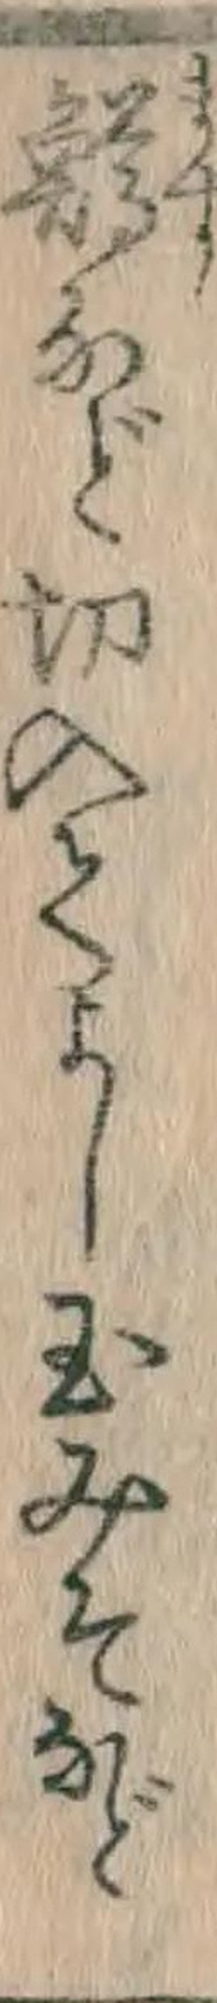鱒など切入てよし玉みせなど
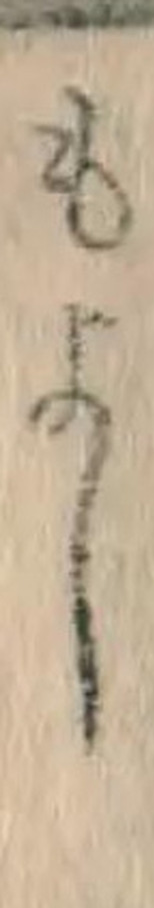もよし
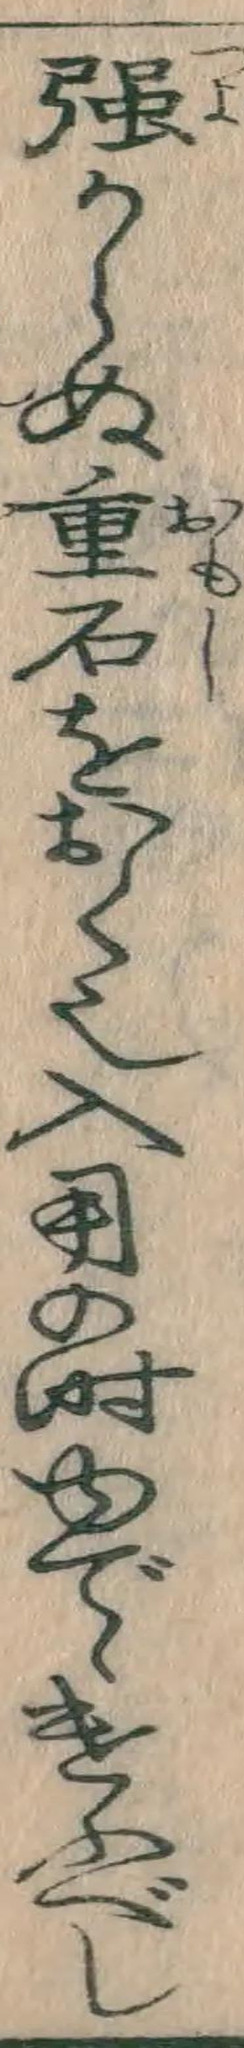強からぬ重石をおく也入用の時ゆでゝ遣ふべし
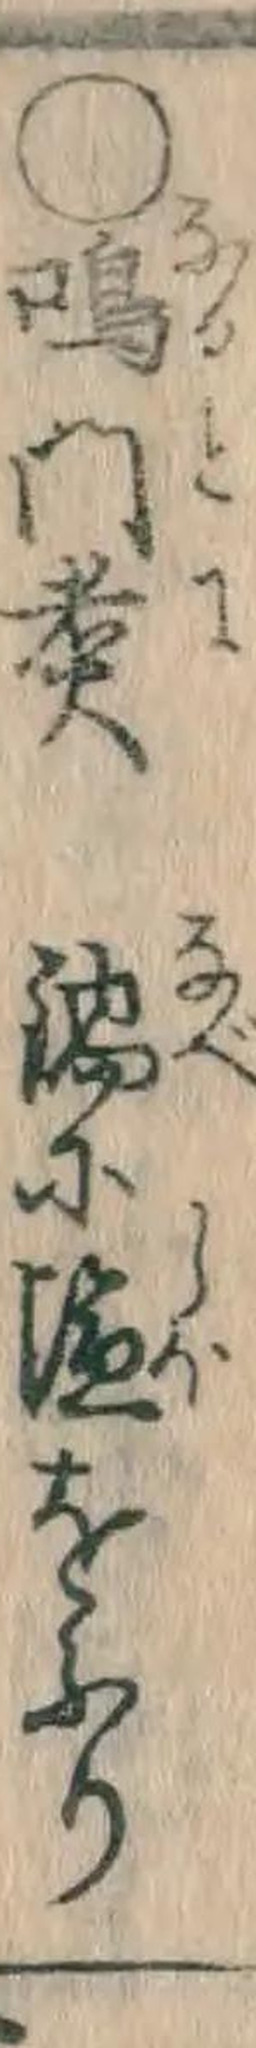○鳴門煮鍋に塩をふり
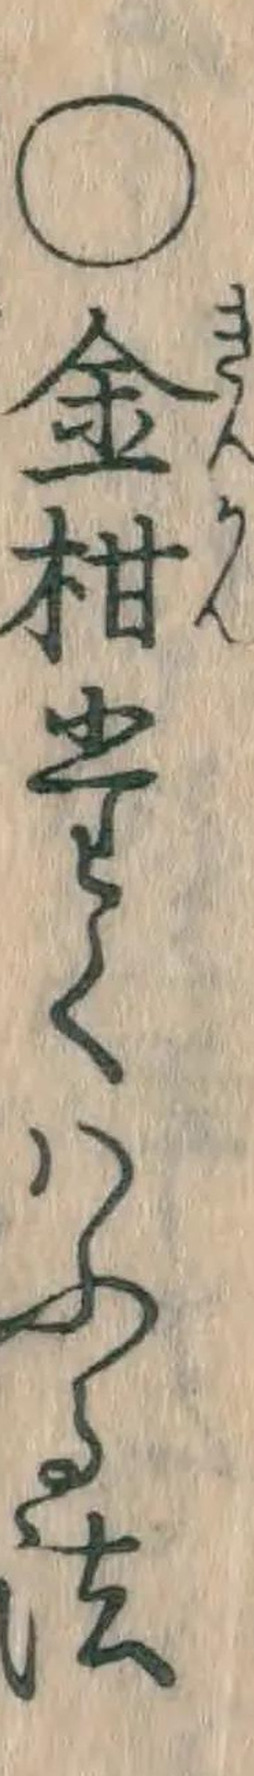○金柑たくはふる法
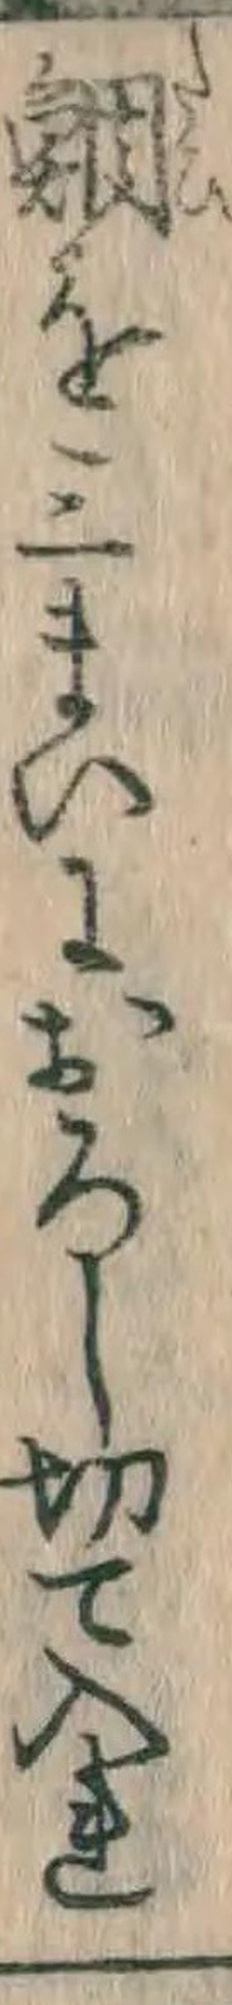鯛を三まいにおろし切て入れ
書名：広益秘事大全 3巻. [5]
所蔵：国立国会図書館 National Diet Library, JAPAN
